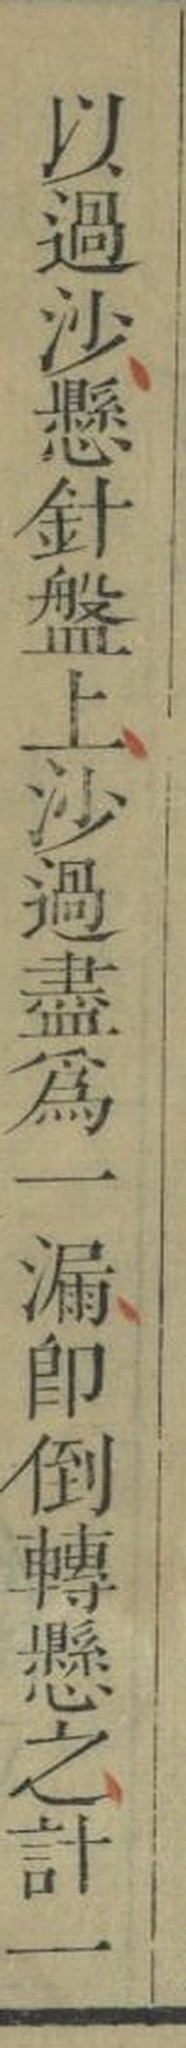以過沙懸針盤上沙過盡爲一漏卽倒轉懸之計一
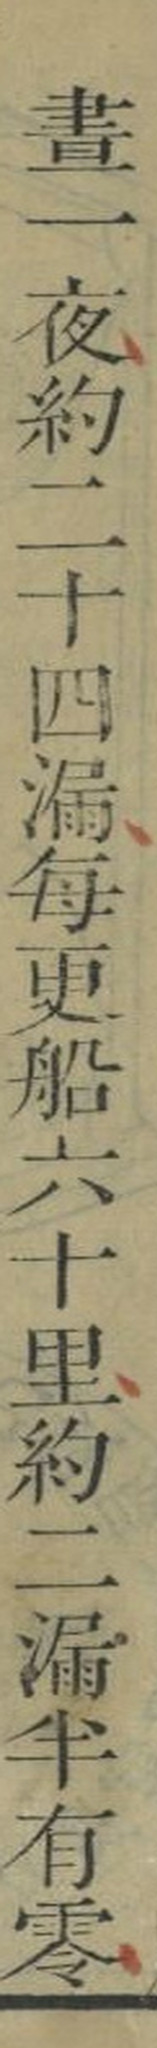晝一夜約二十四漏每更船六十里約二漏半有零
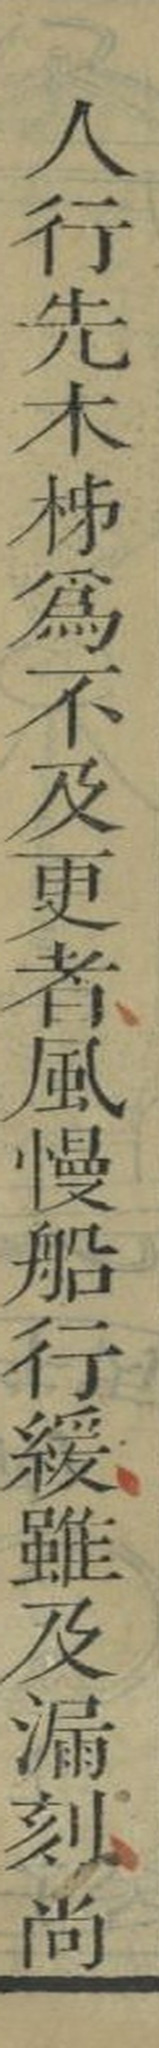人行先木柹爲不及更者風慢船行緩雖及漏刻尚
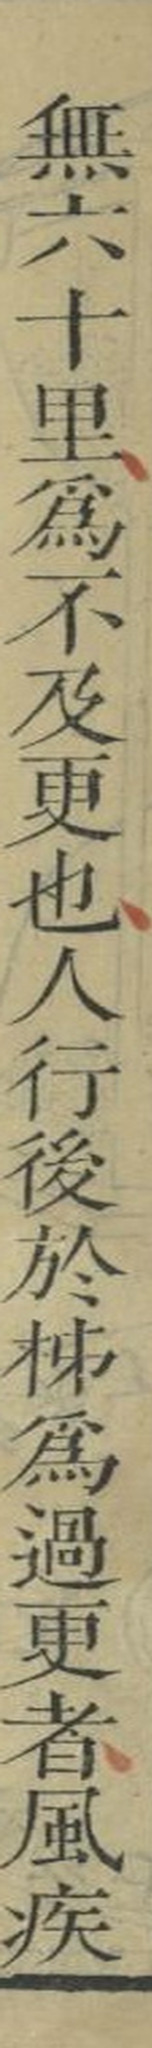無六十里爲不及更也人行後於柹爲過更者風疾
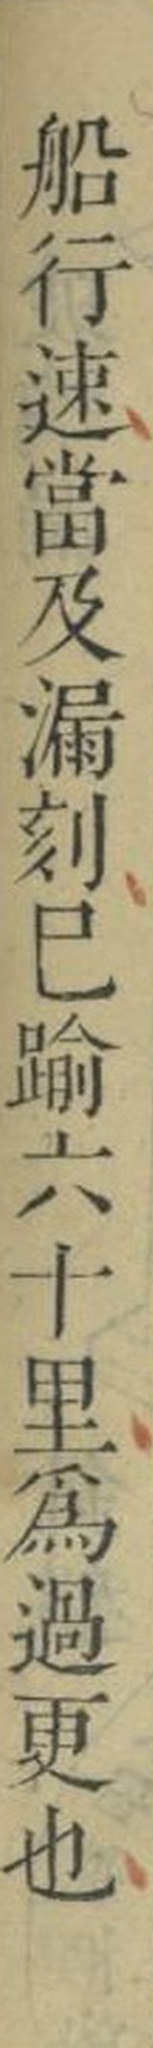船行速當及漏刻巳踰六十里爲過更也

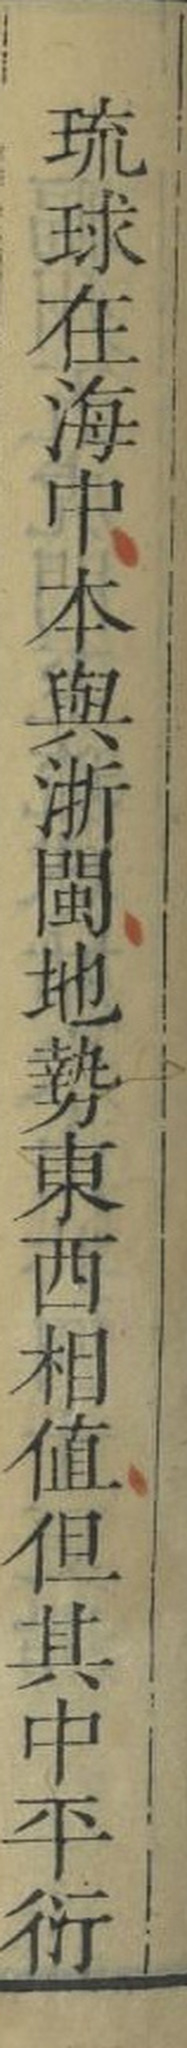琉球在海中本與浙閩地勢東西相値但其中平衍
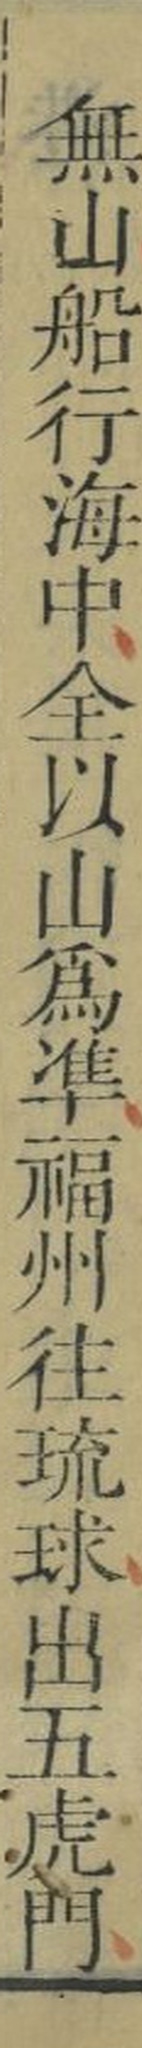無山船行海中全以山爲凖福州往琉球出五虎門
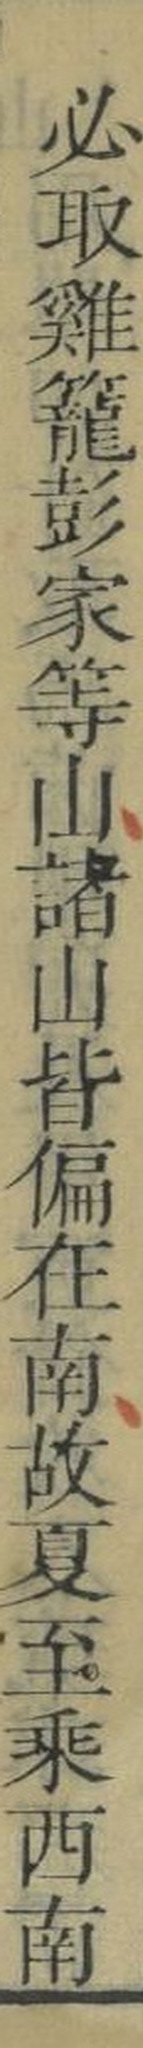必取雞籠彭家等山諸山皆偏在南故夏至乘西南
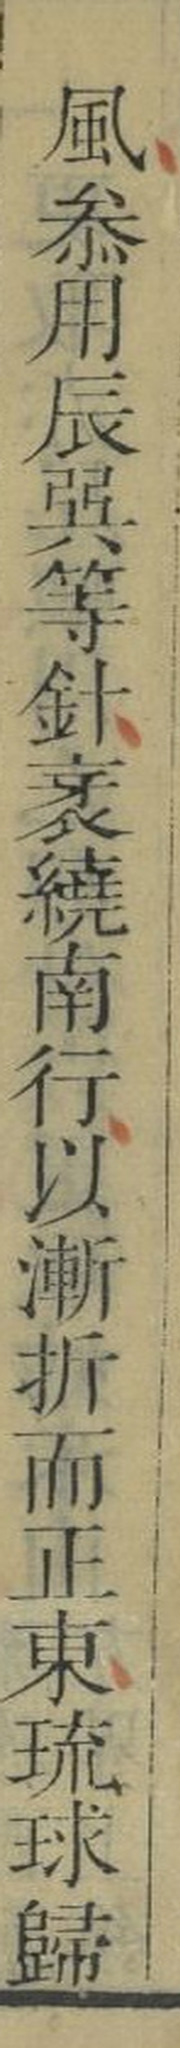風叅用辰巽等針袤繞南行以漸折而正東琉球歸
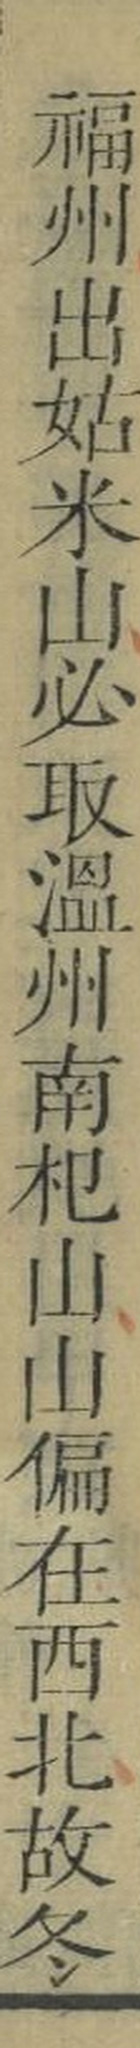福州出姑米山必取溫州南杞山山偏在西北故冬
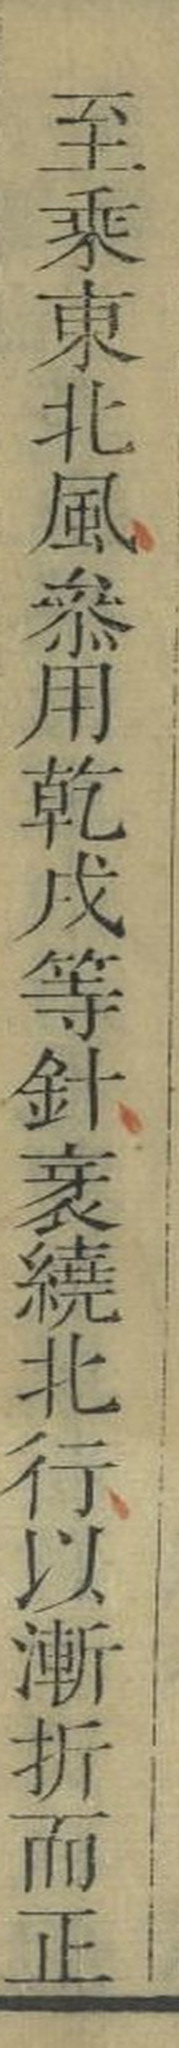至乘東北風叅用乾戌等針袤繞北行以漸折而正
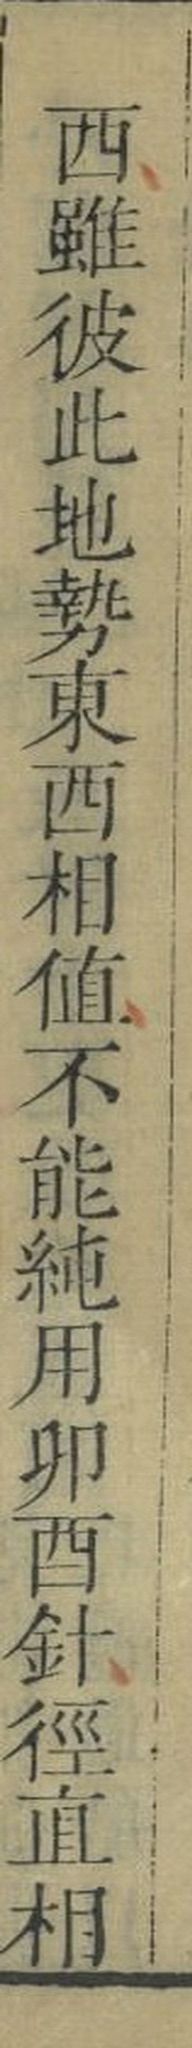西雖彼此地勢東西相値不能純用卯酉針徑直相
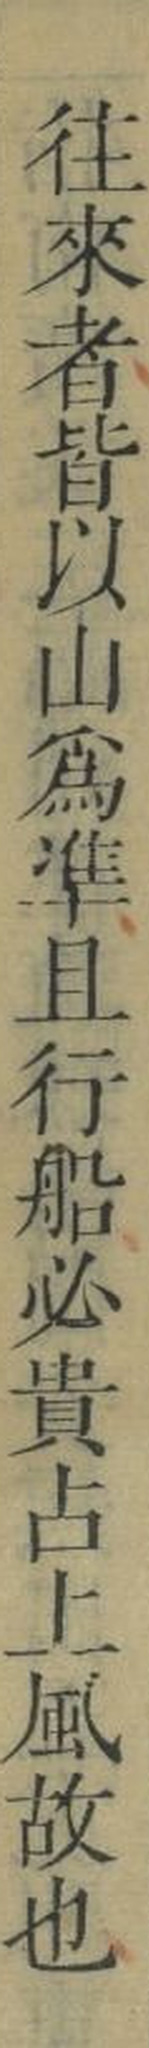往來者皆以山爲凖且行船必貴占上風故也

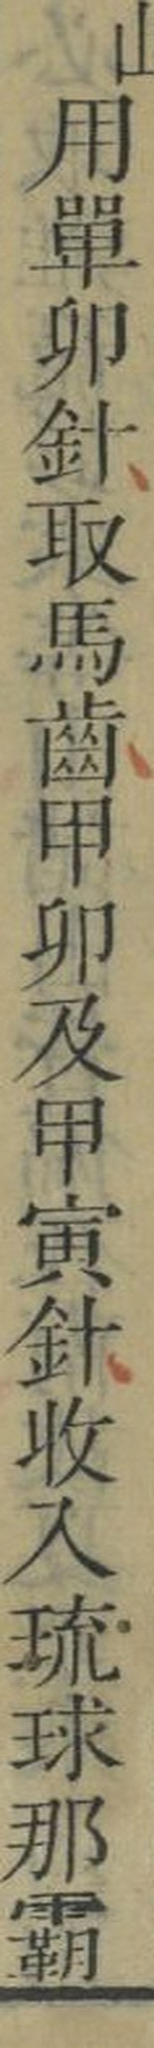山用單卯針取馬齒甲卯及甲寅針收入琉球那霸
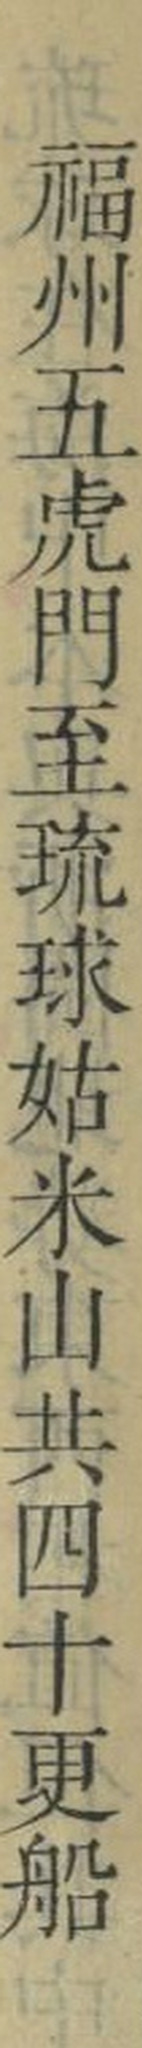福州五虎門至琉球姑米山共四十更船
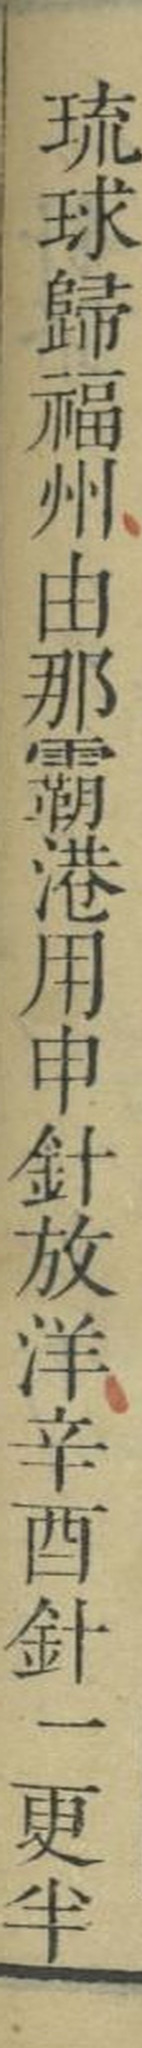琉球歸福州由那霸港用申針放洋辛酉針一更半
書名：中山伝信録 巻一、巻二
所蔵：University of the Ryukyus Library
